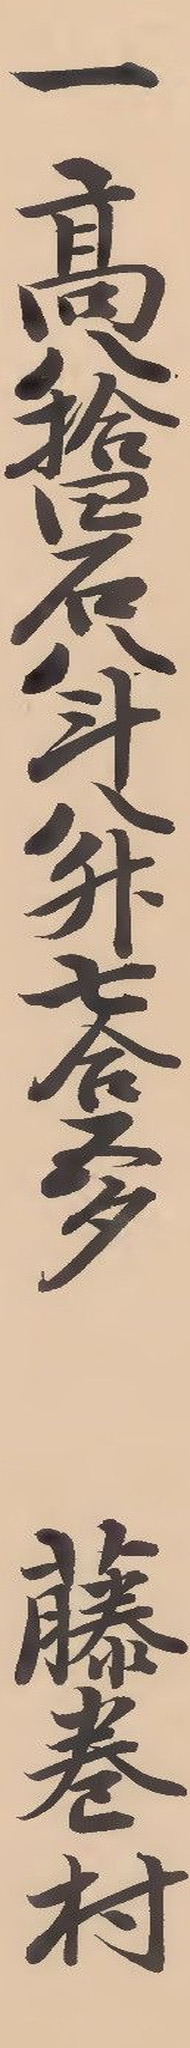一高八拾四石八斗八升七合五勺藤巻村
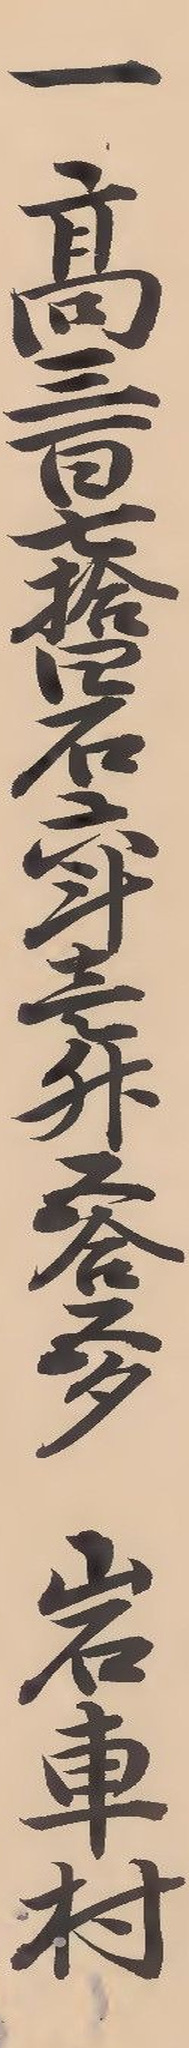一高三百七拾四石六斗壱升五合五勺岩車村
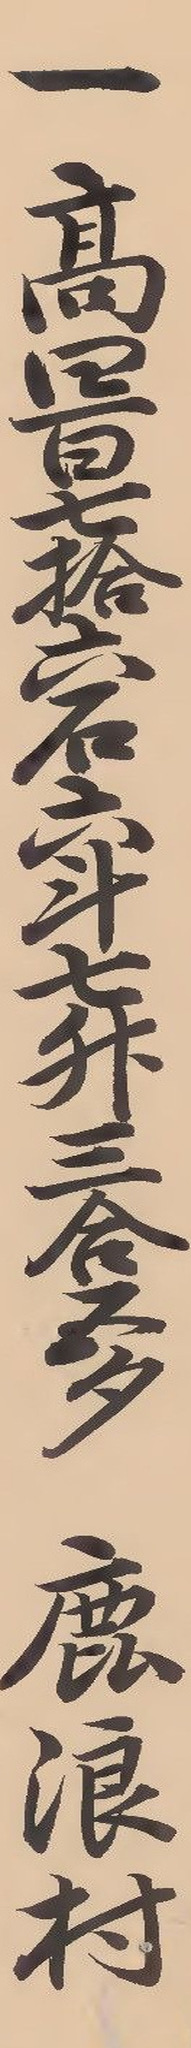一高四百七拾六石六斗七升三合五勺鹿浪村
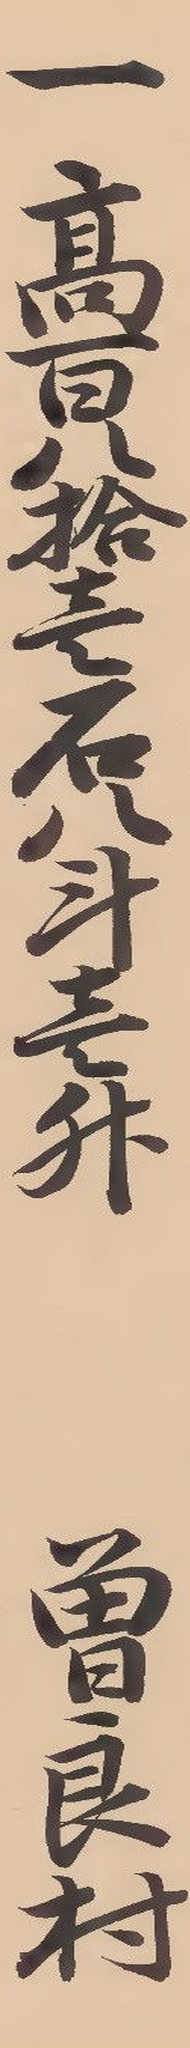一高百八拾壱石八斗壱升曽良村
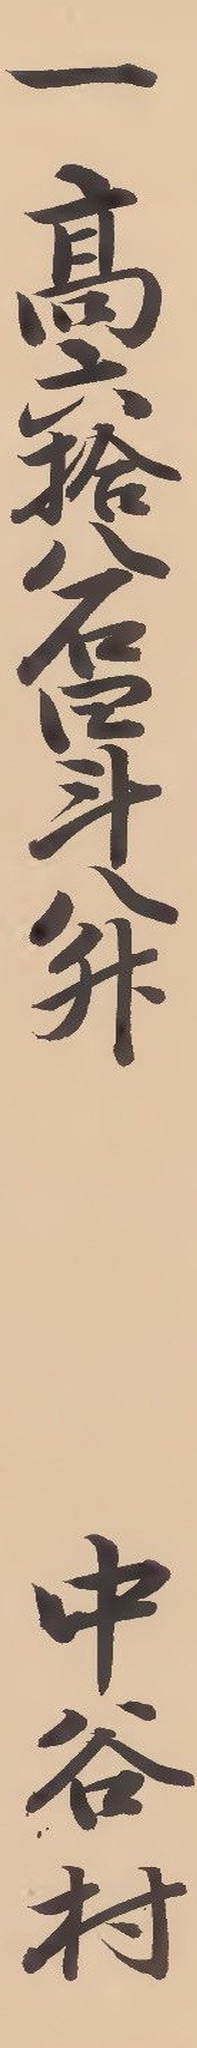一高六拾八石四斗八升中谷村
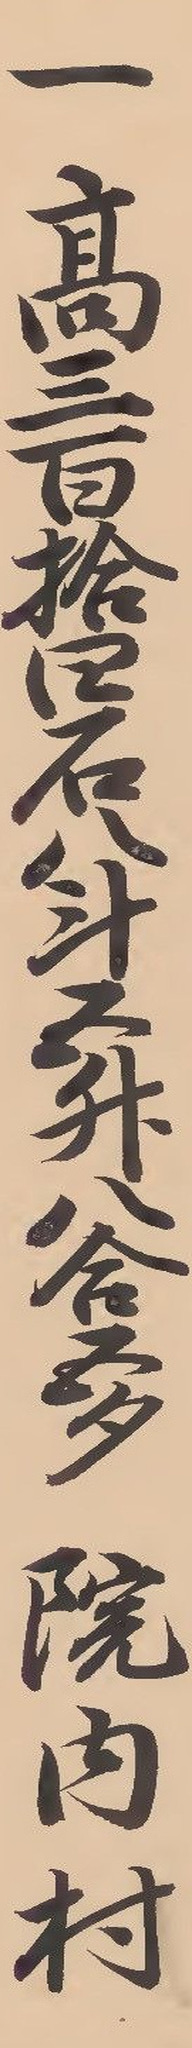一高三百拾四石八斗五升八合五勺院内村

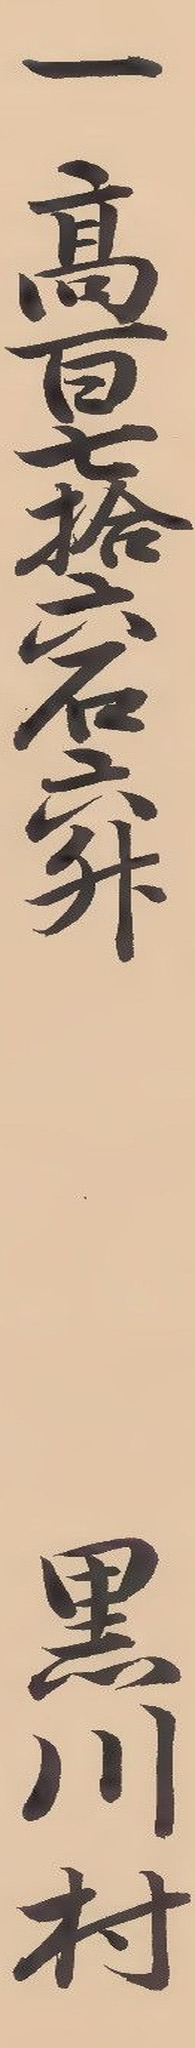一高百七拾六石六升黒川村
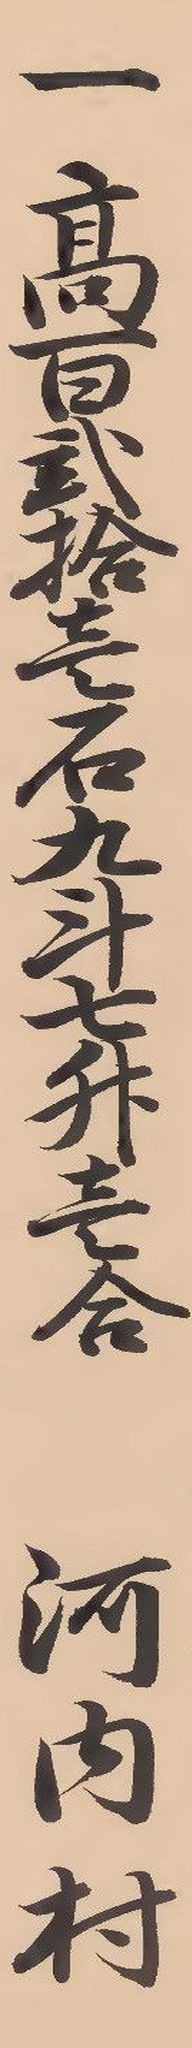一高百弐拾壱石九斗七升壱合河内村
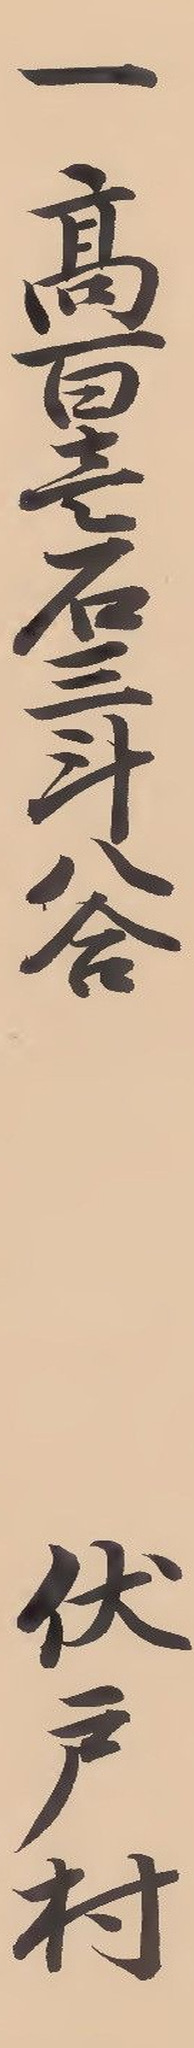一高百壱石三斗八合伏戸村
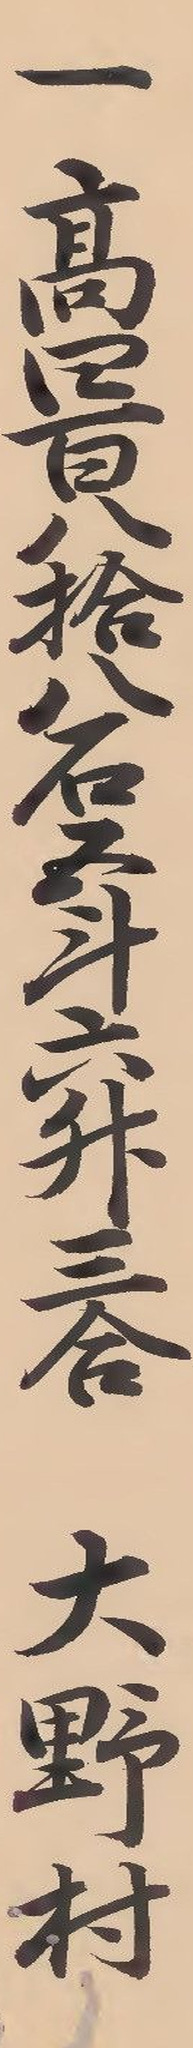一高四百八拾八石五斗六升三合大野村
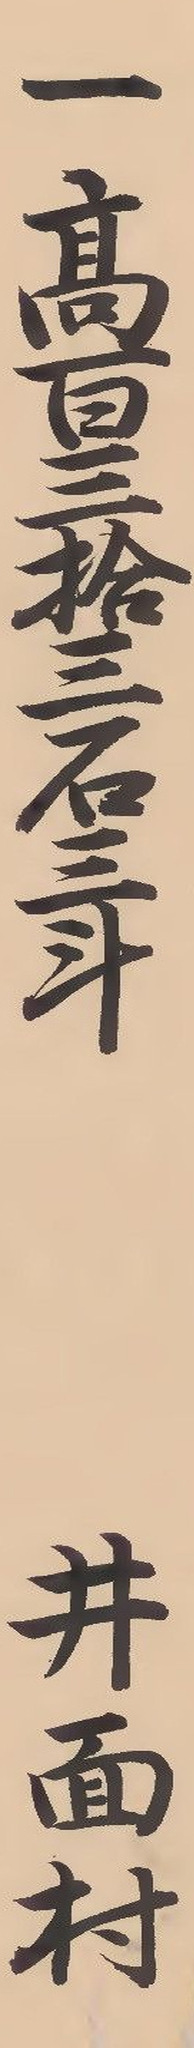一高百三拾三石三斗井面村

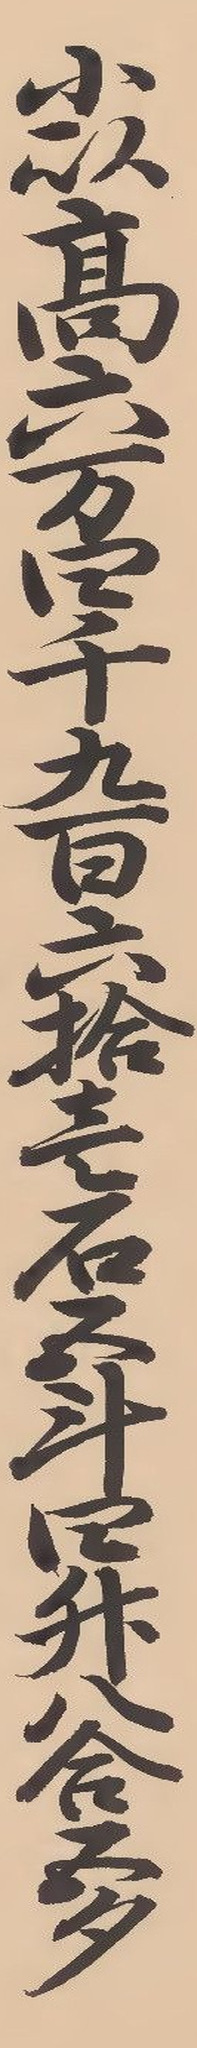小以高六万四千九百六拾壱石五斗四升八合五勺
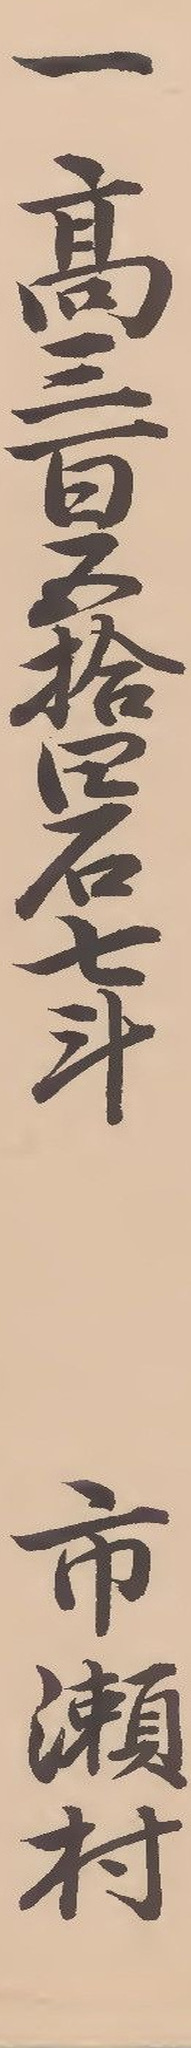一高三百五拾四石七斗市瀬村

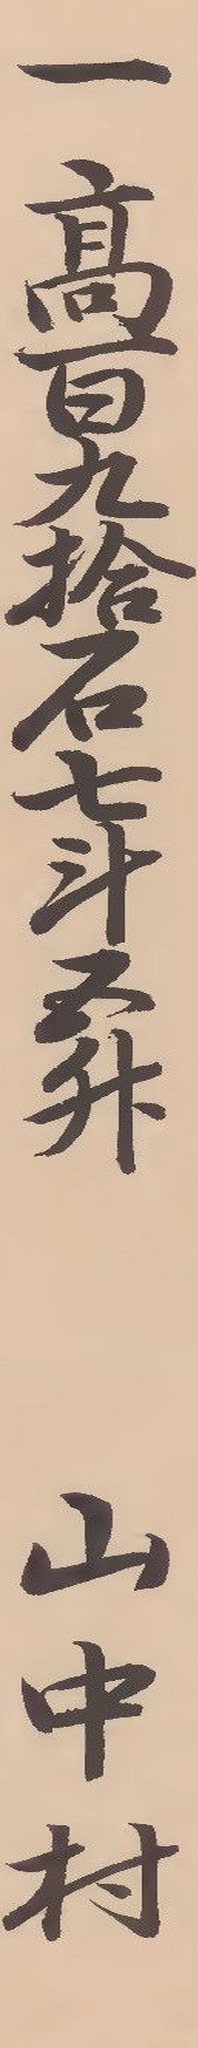一高百九拾石七斗五升山中村
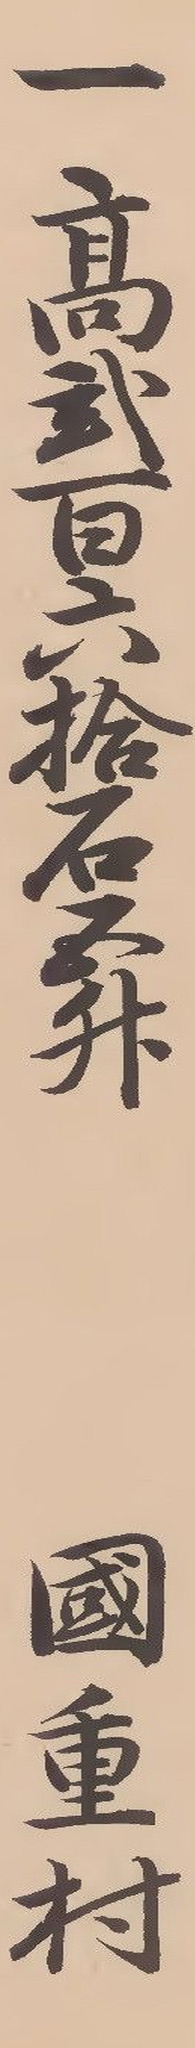一高弐百六拾石五升国重村
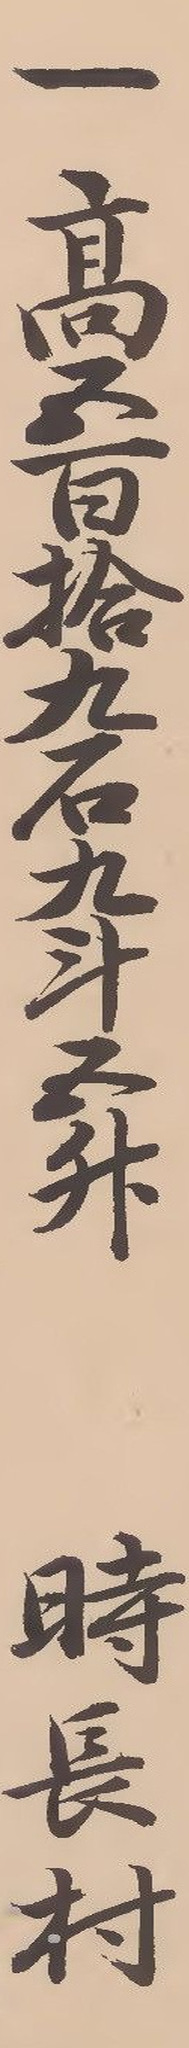一高五百拾九石九斗五升時長村
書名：能登国郷帳
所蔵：国立公文書館 National Archives of Japan
